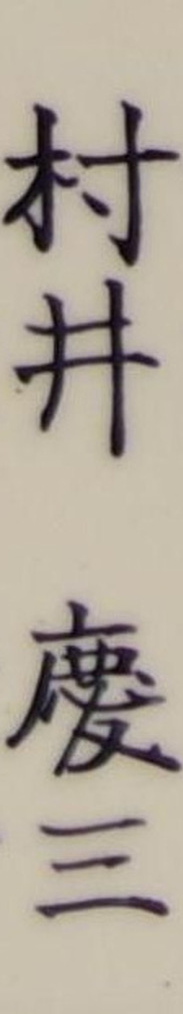村井慶三
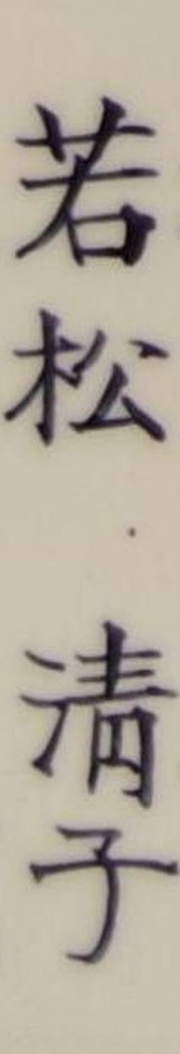若松清子
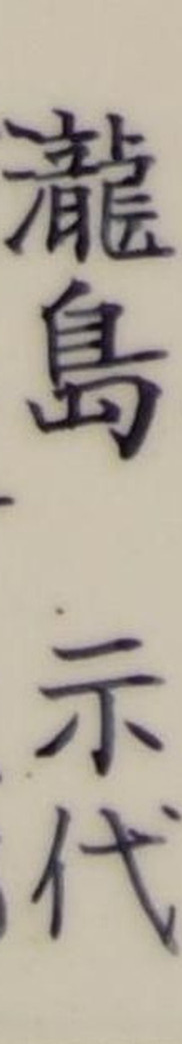瀧島示代
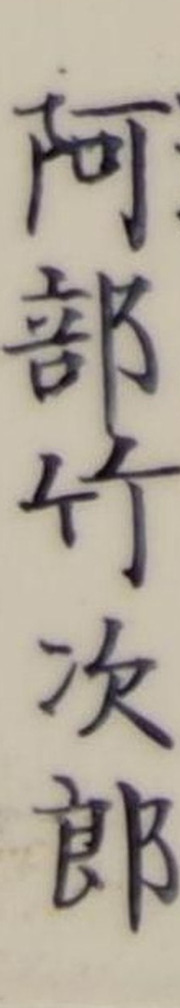阿部竹次郎

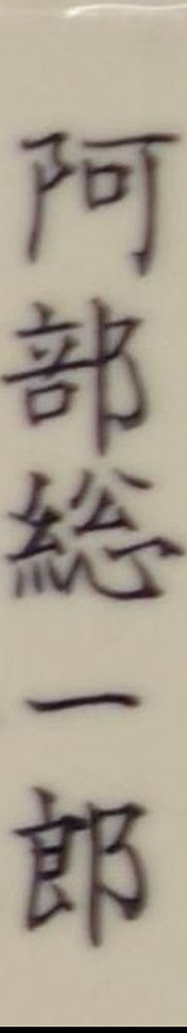阿部総一郎
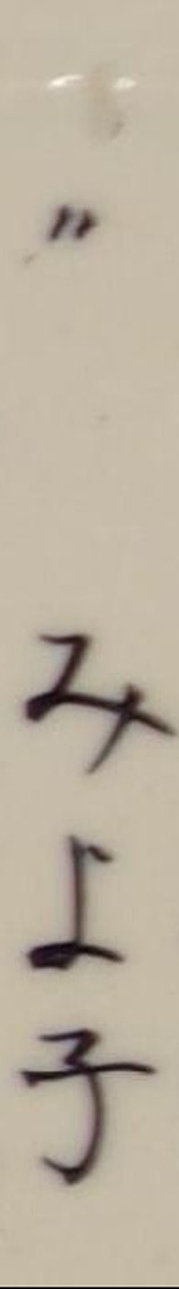みよ子
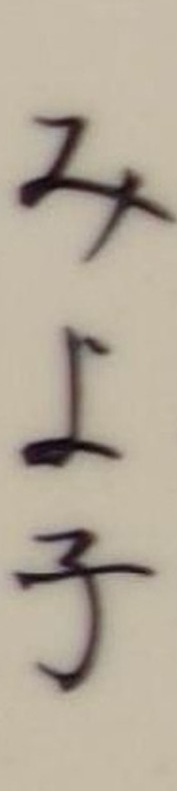みよ子
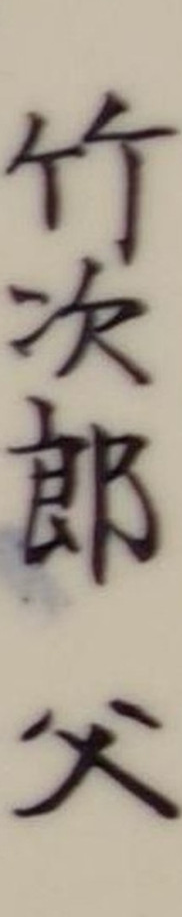竹次郎父
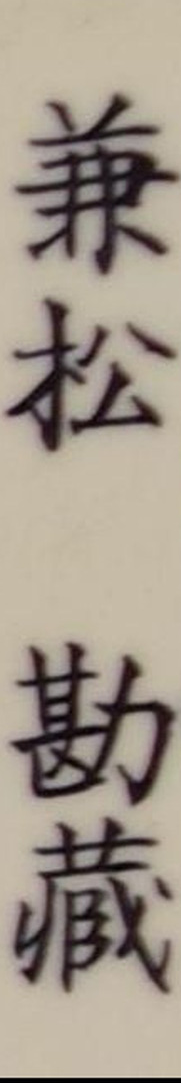兼松勘蔵
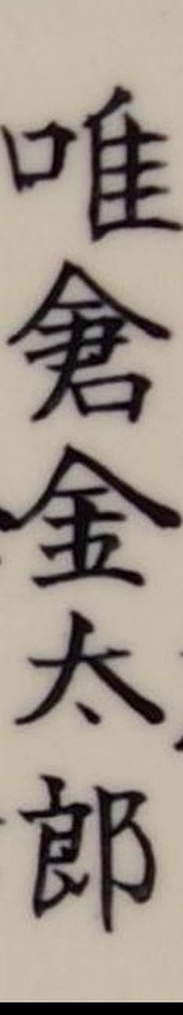唯倉金太郎
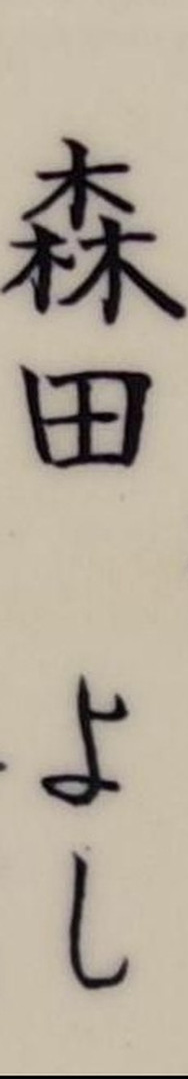森田よし
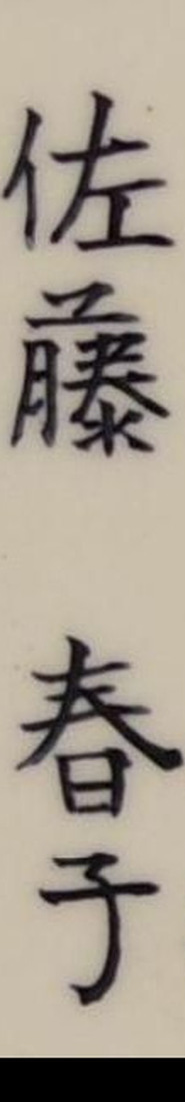佐藤春子
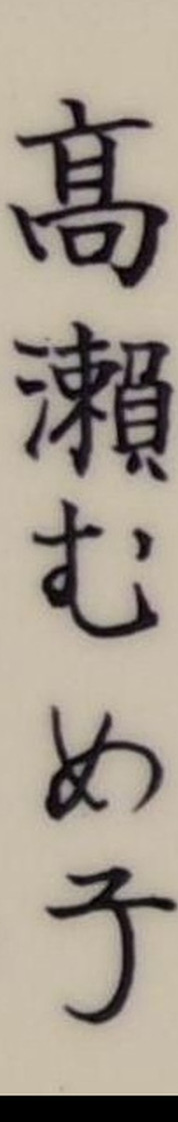高瀬むめ子
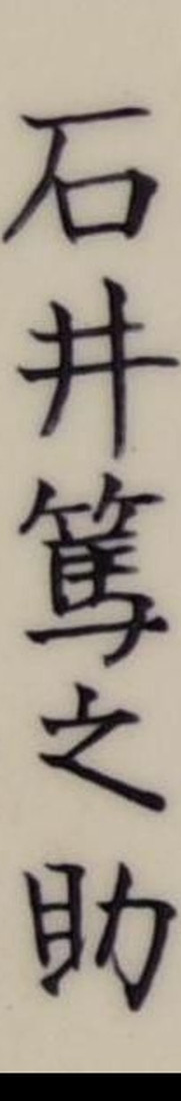石井篤之助
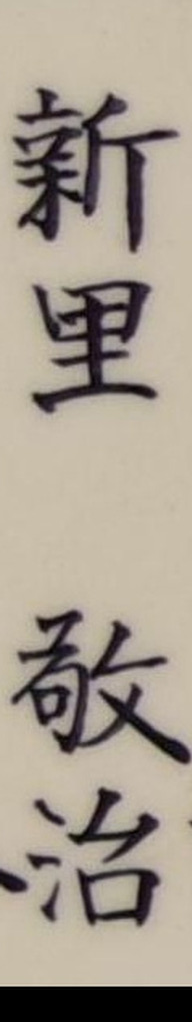新里敬治

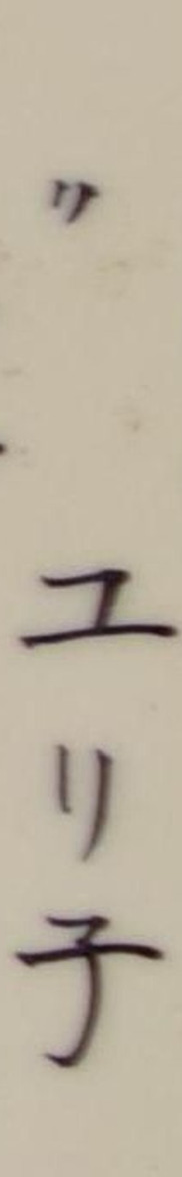ユリ子
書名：E~L
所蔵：高野山金剛峯寺
